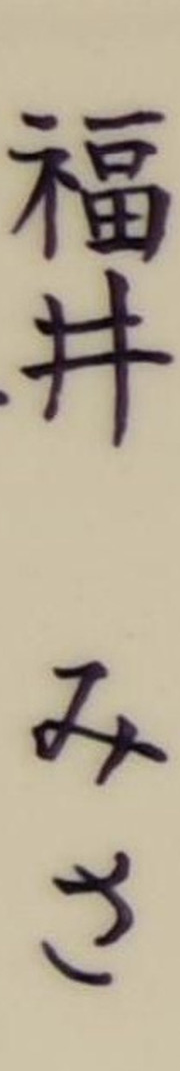福井みさ
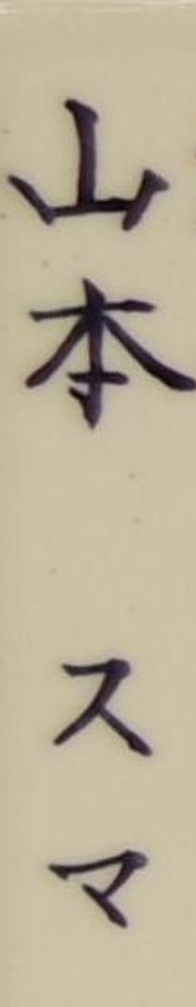山本スマ

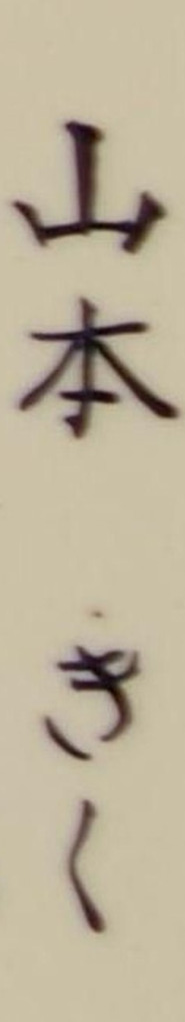山本きく
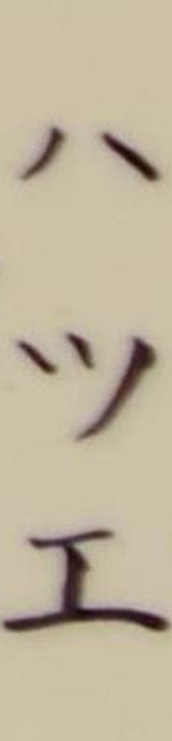ハツエ
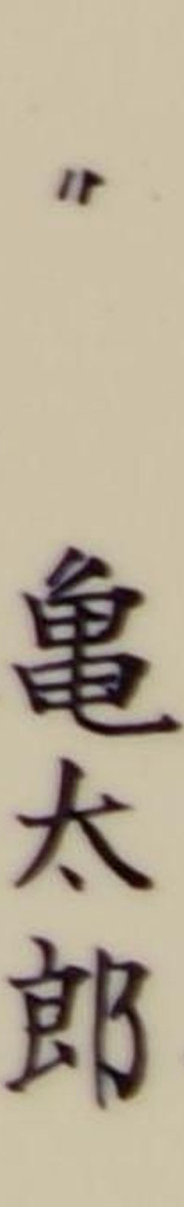亀太郎
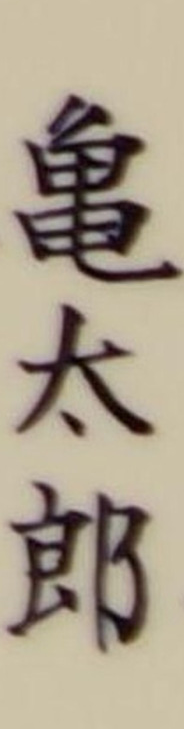亀太郎
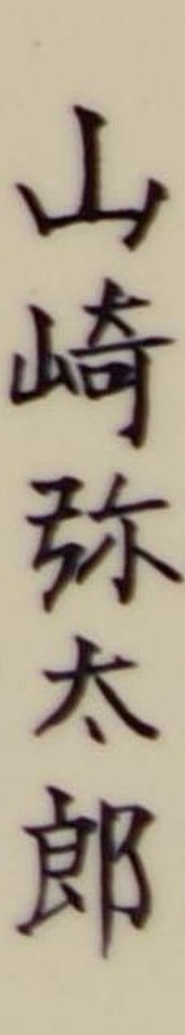山崎弥太郎
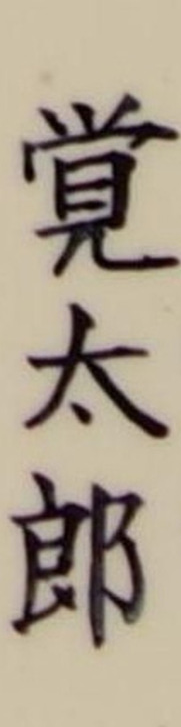覚太郎
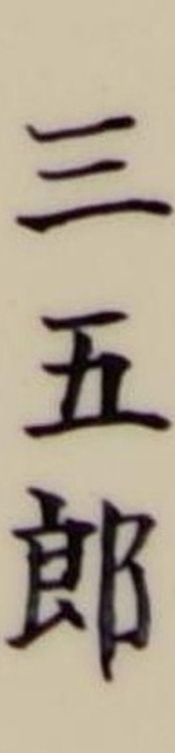三五郎
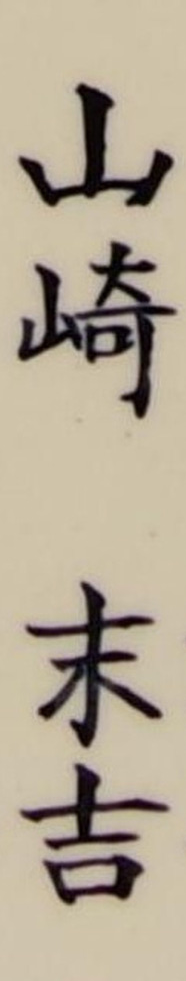山崎末吉
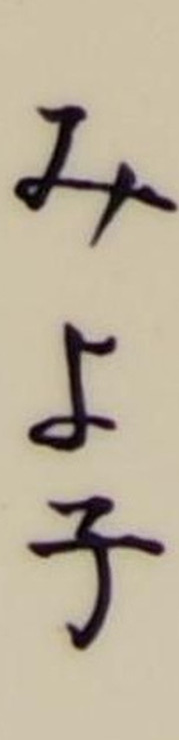みよ子
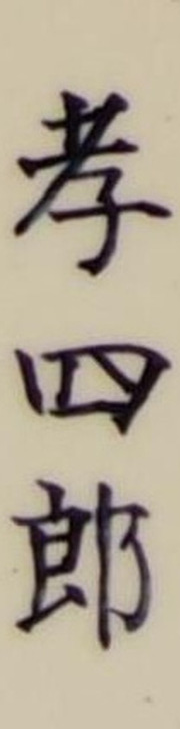孝四郎
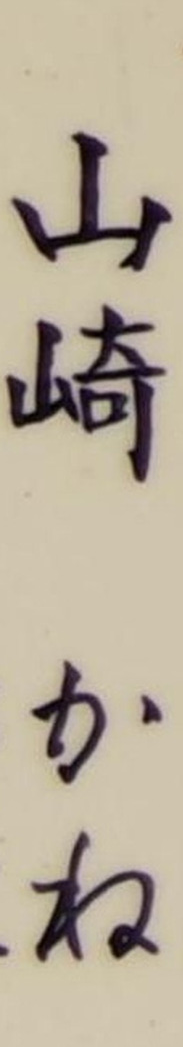山崎かね
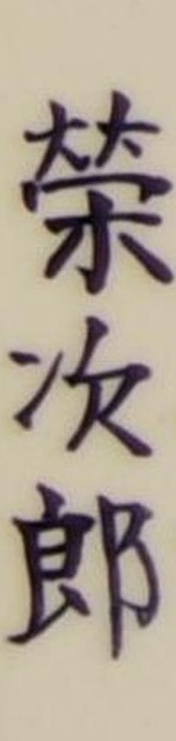榮次郎

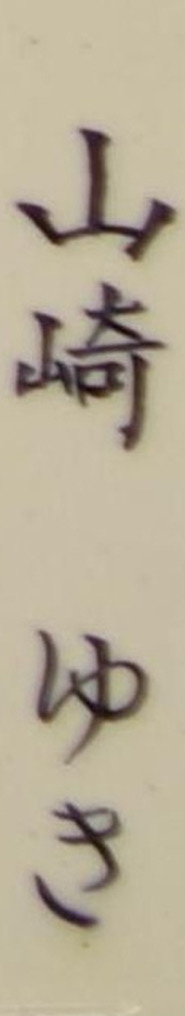山崎ゆき
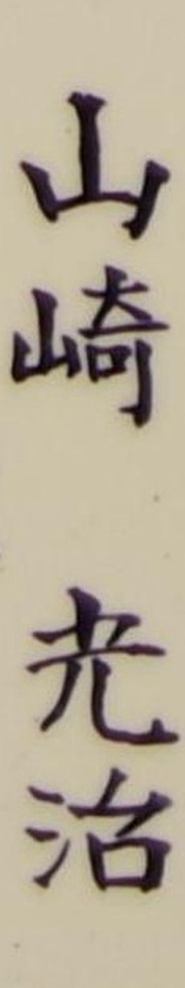山崎光治
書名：A~D
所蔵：koyasan kongobuji
